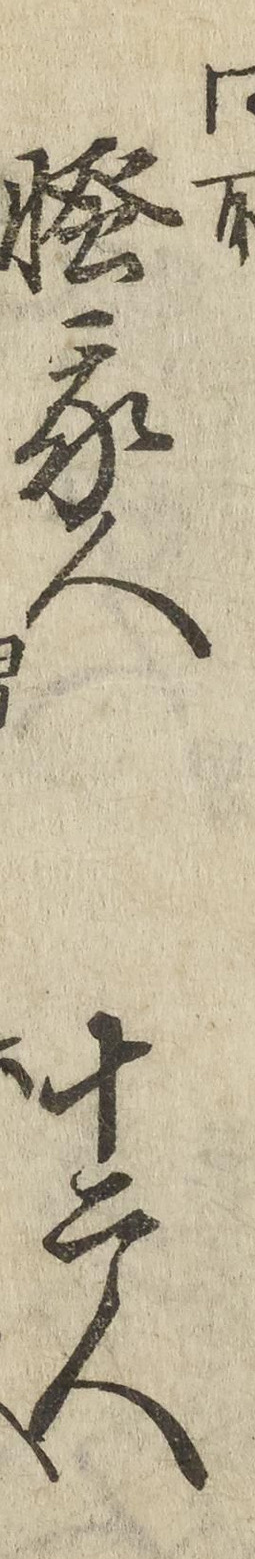怪我人十二人
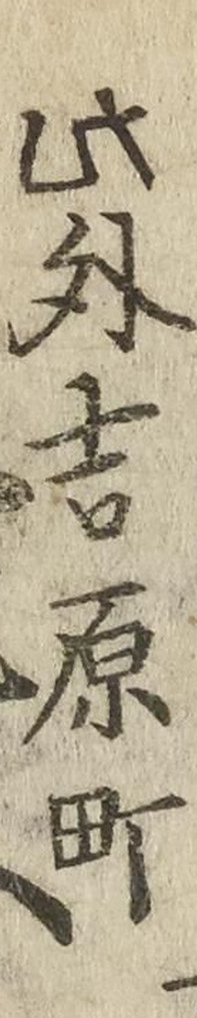此外吉原町
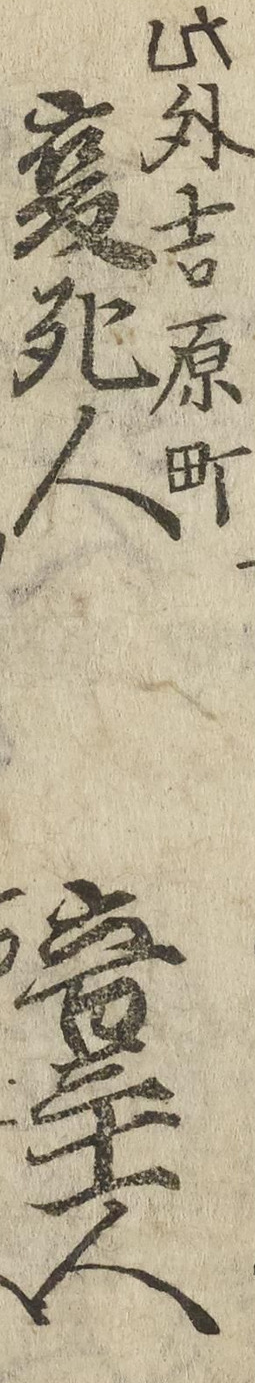変死人六百三十一人
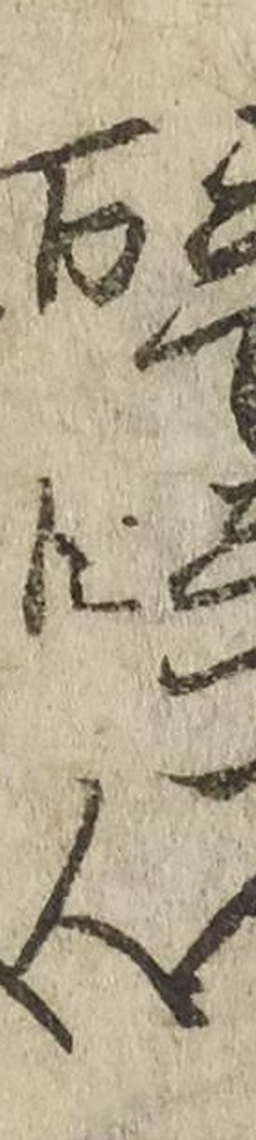女四人
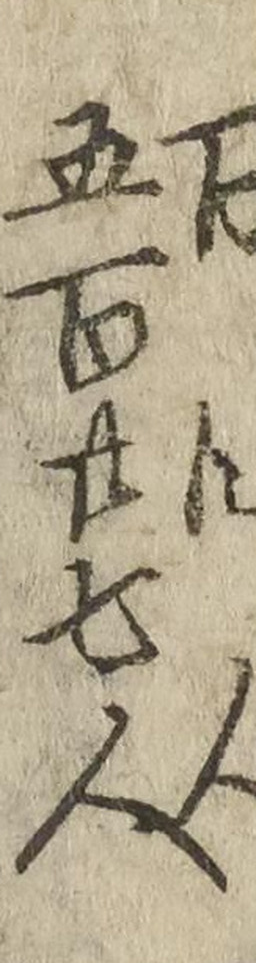女五百廿七人
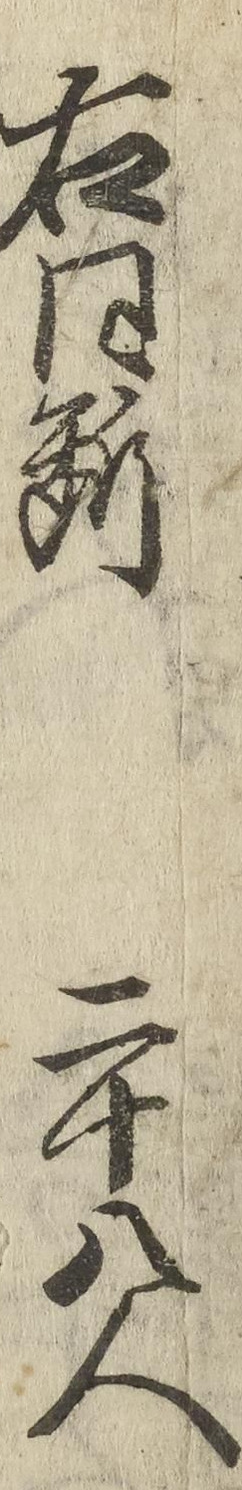右同断二十八人
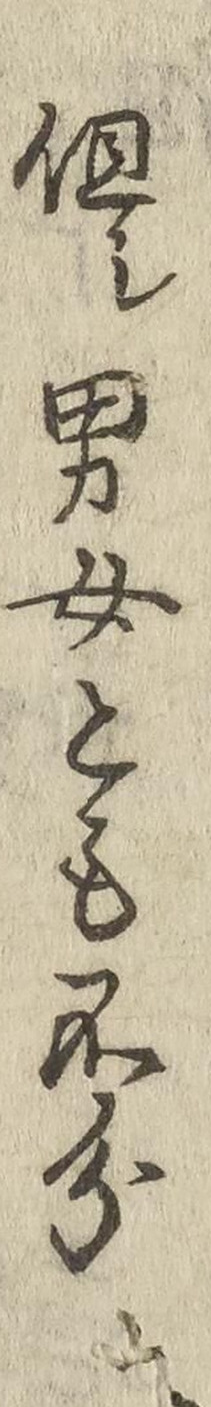但し男女共不分
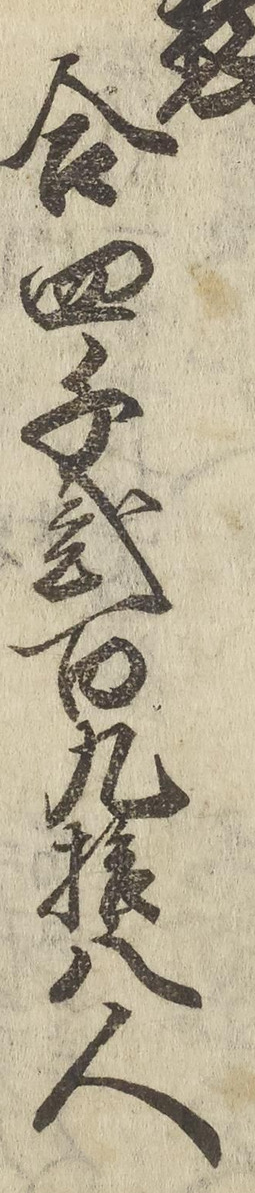惣合四千弐百九拾八人
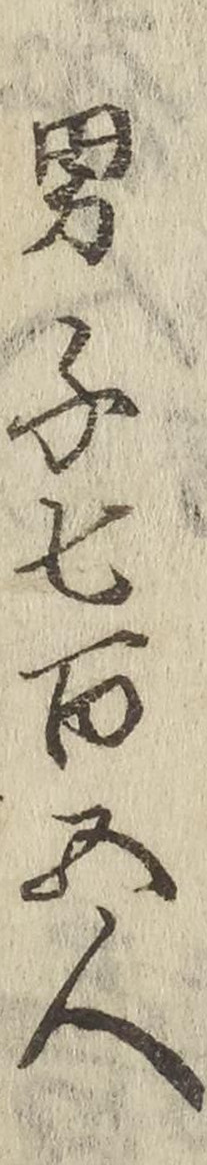内男千七百五人
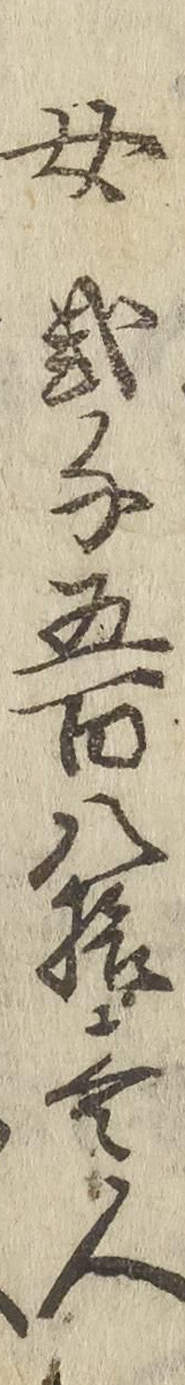女弐千五百八拾壱人
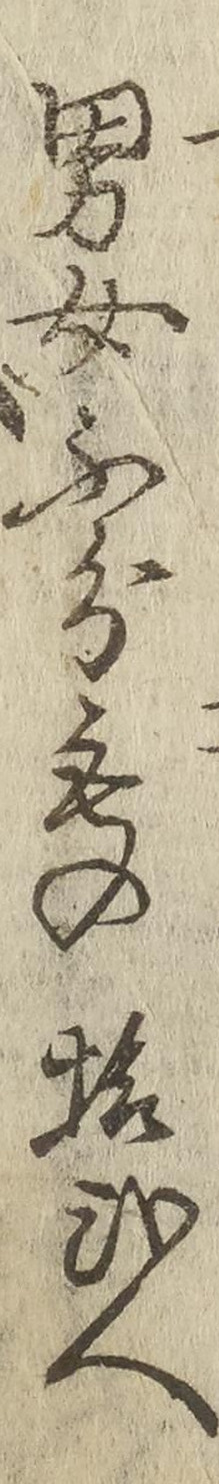男女不分もの拾弐人
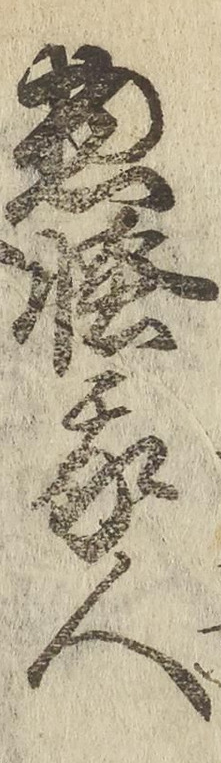惣怪我人
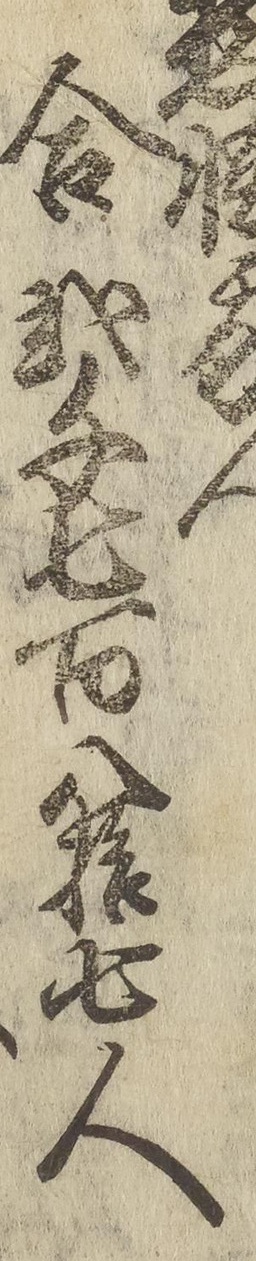合弐千七百八拾七人
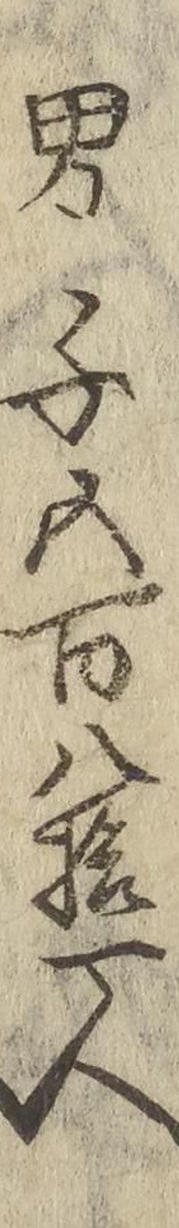内男千五百八拾一人
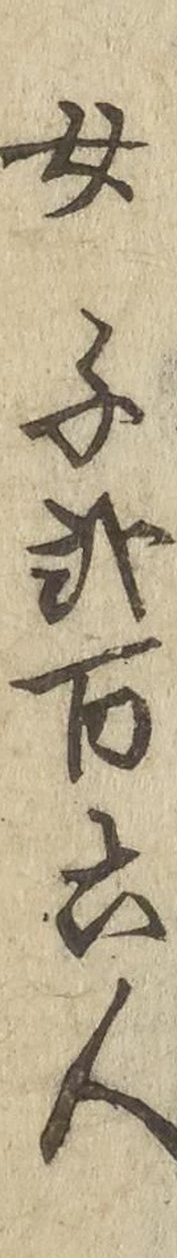女千弐百六人

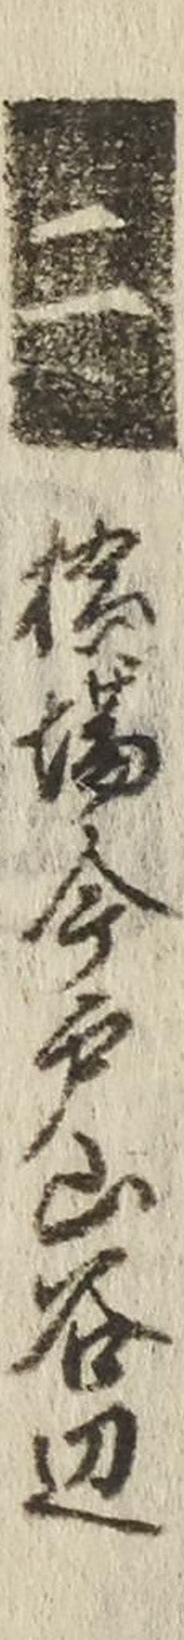二橋場今戸山谷辺
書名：地震出火　男女死人怪我人書上之寫
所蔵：東京大学地震研究所図書室 Earthquake Research Institute Library, The University of Tokyo, JAPAN
